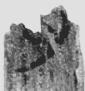又（有）
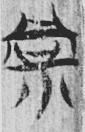○（常）
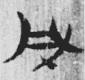凡
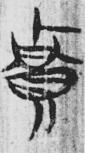貴
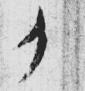人
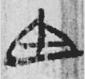甶（思）
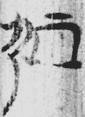○（處）
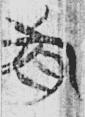前
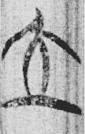立（位）
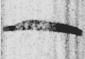一
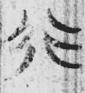行
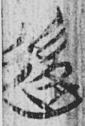○（後）
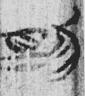則
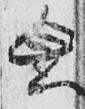見
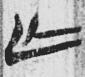亡
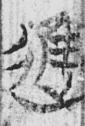進
